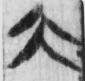大
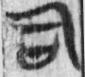司
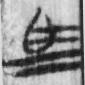馬
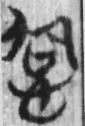○（悼）
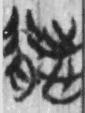○（滑）
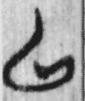㠯（以）
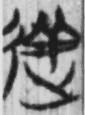𨒫（將）
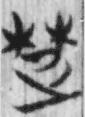楚
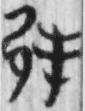邦
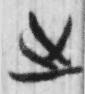之
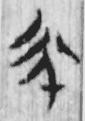帀（師）
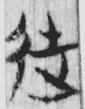徒
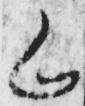㠯（以）
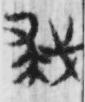○（救）
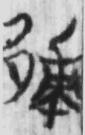郙
